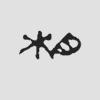相
